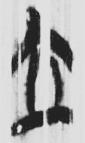立
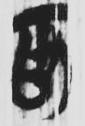爲
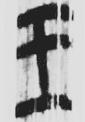王
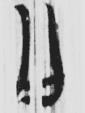公
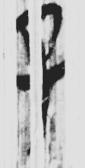子
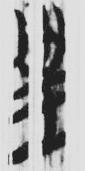皇
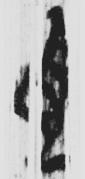見
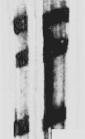王
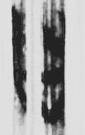曰
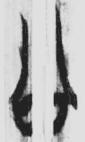公
